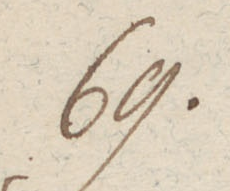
69.
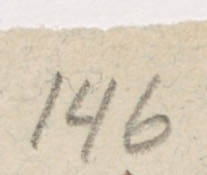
146
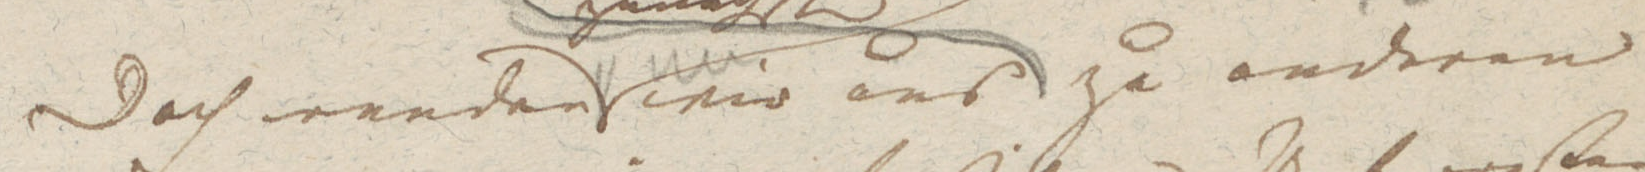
Doch wenden zunächst wir uns zunächst zu anderen
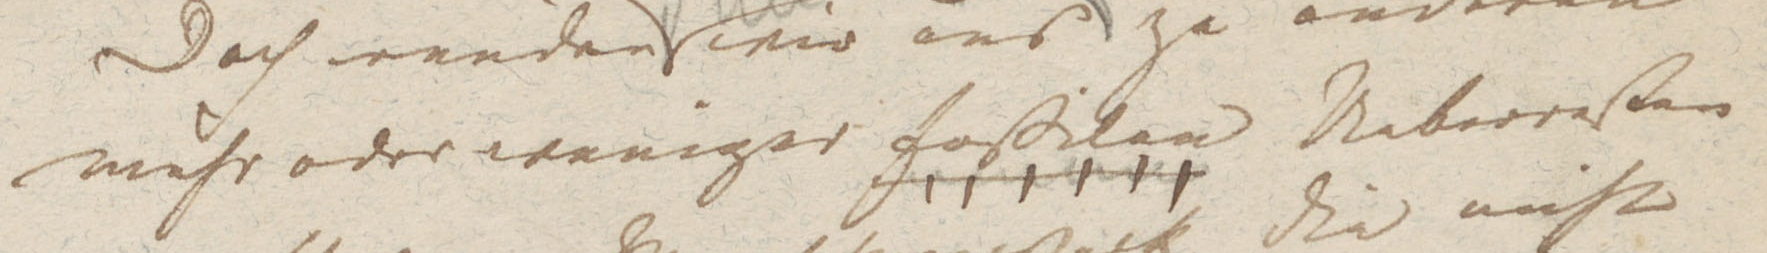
mehr oder weniger fossilenfossilen Ueberresten
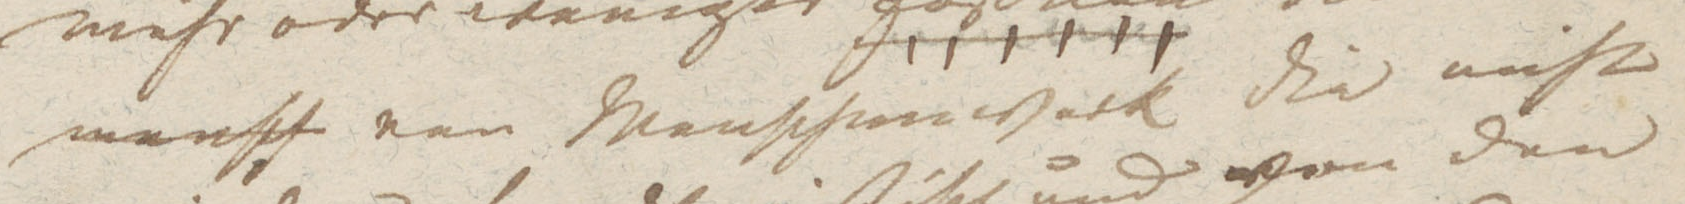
mensch von Menschenwerk die nicht
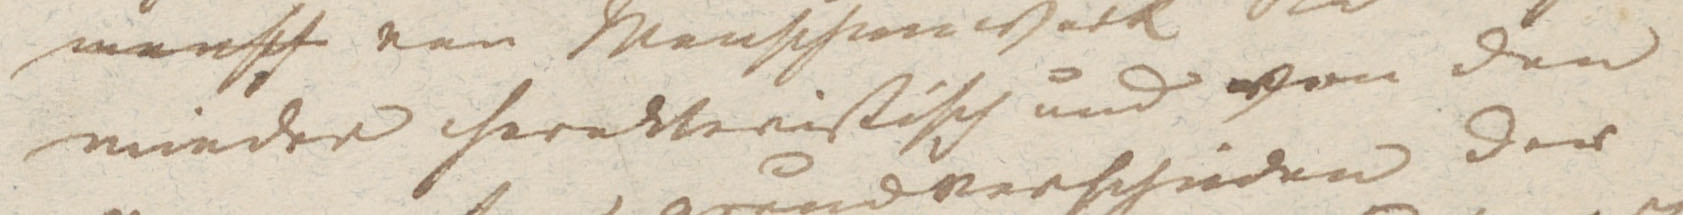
minder charakteristisch und von den
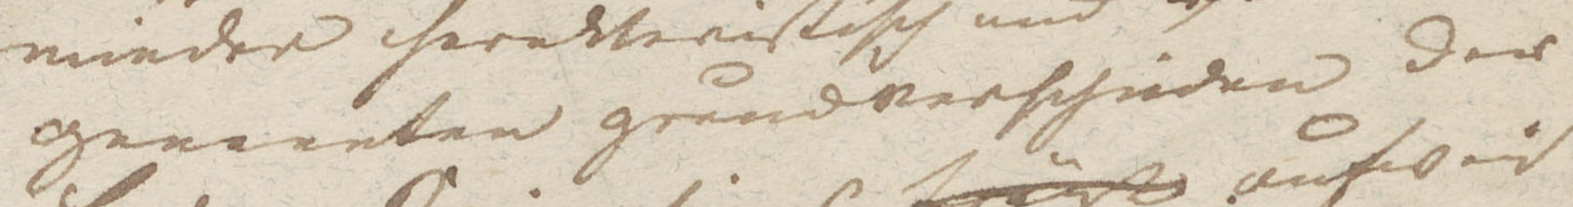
genannten grundverschieden der
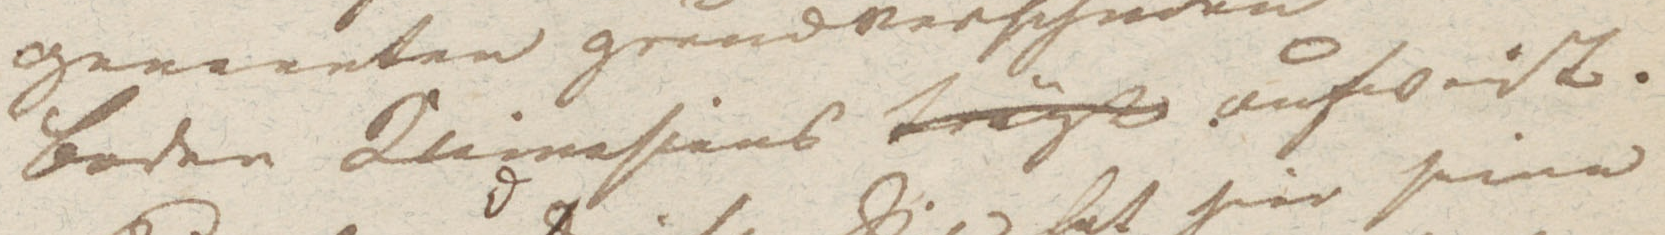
Boden Kleinasiens trägt aufweist.
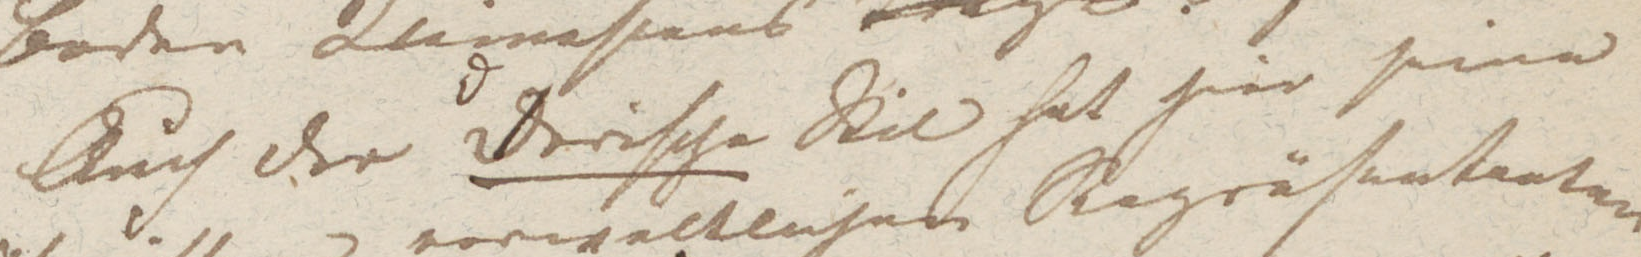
Auch der Ddorische Stil hat hier seine
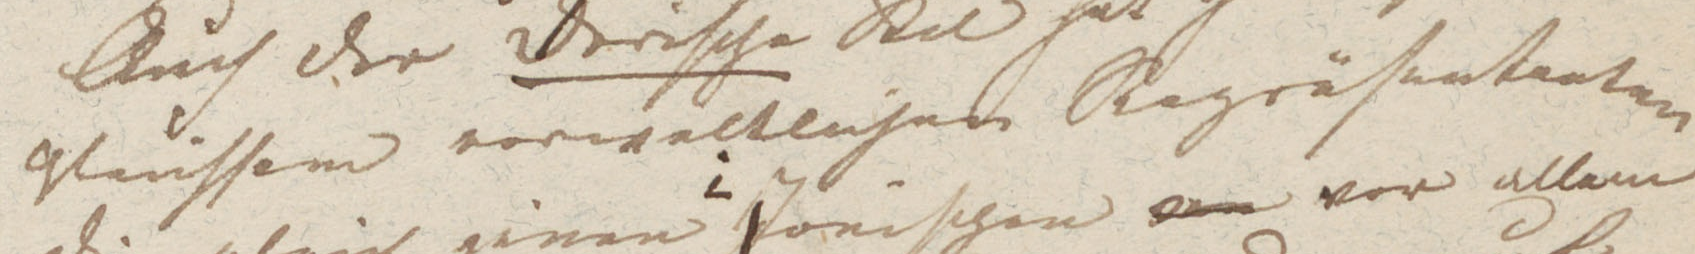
gleichsam vorweltlichen Repräsentanten
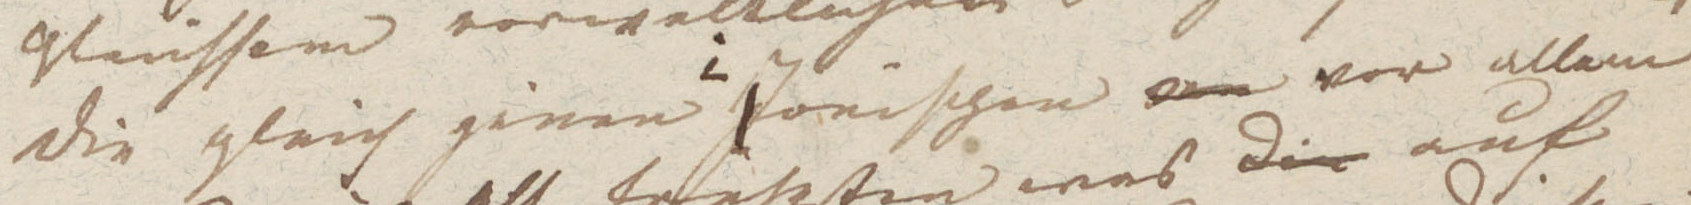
die gleich jenen Iionischen von vor allem
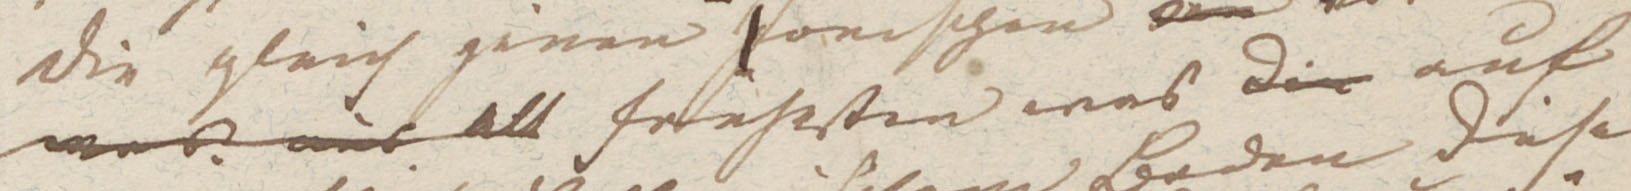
was aus alt Frühesten was die auf
